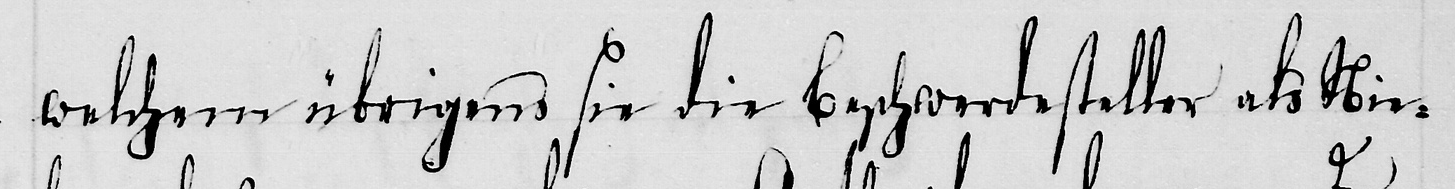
welchem übrigens sie die Beschwerdesteller als Nie¬
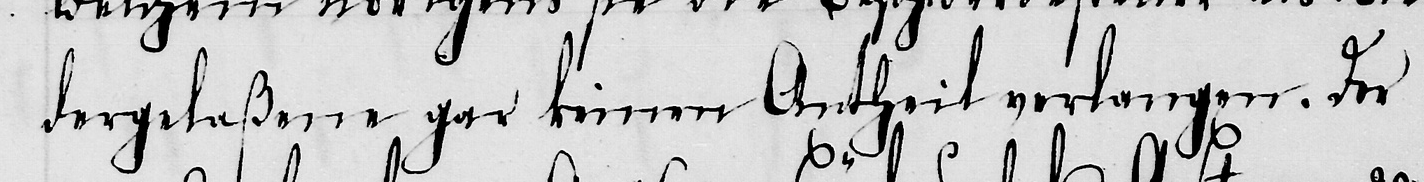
dergelaßene gar keinen Antheil verlangen. Der
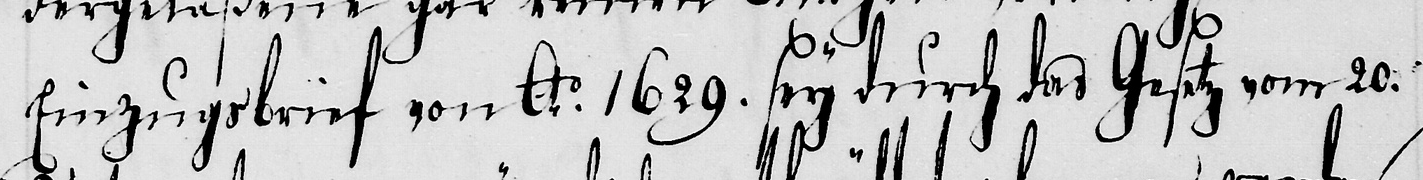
Einzugsbrief von A°. 1629. sey durch das Gesetz vom 20.
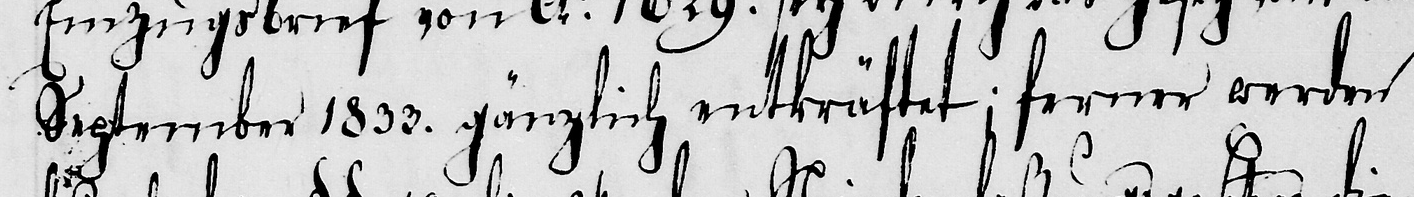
September 1833. gänzlich entkräftet; ferner werden
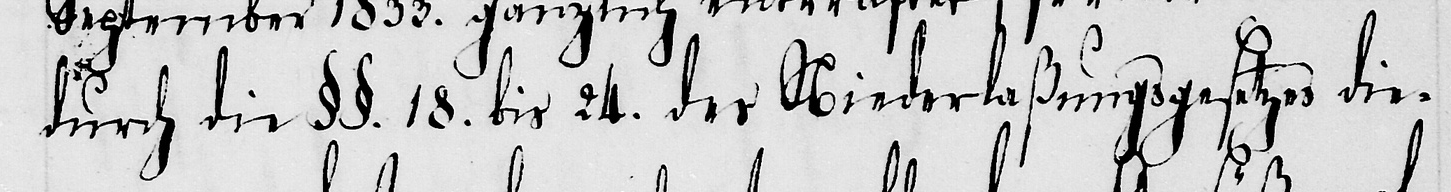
durch die §§. 18. bis 24. des Niederlaßungsgesetzes die¬
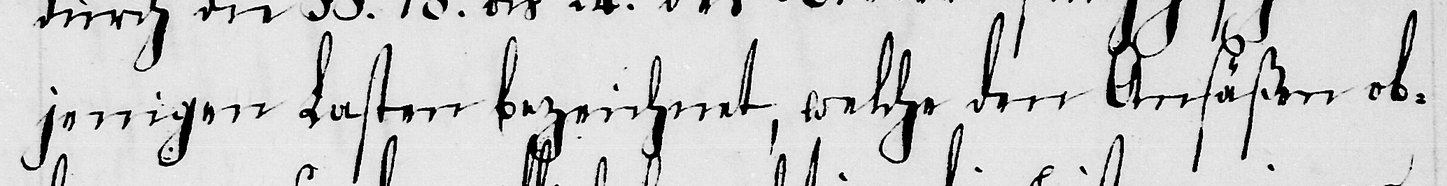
jenigen Lasten bezeichnet, welche den Ansäßen ob¬
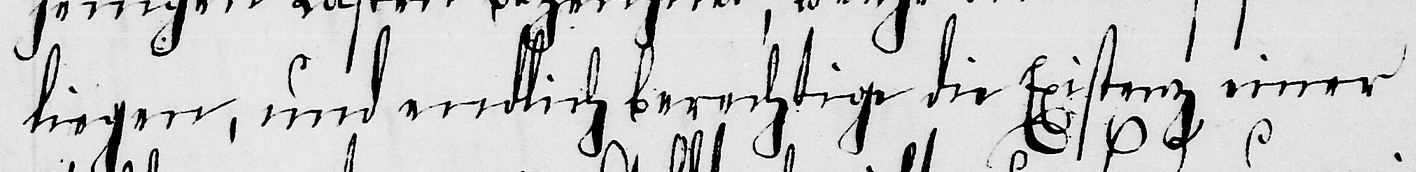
liegen, und endlich berechtige die Existenz einer
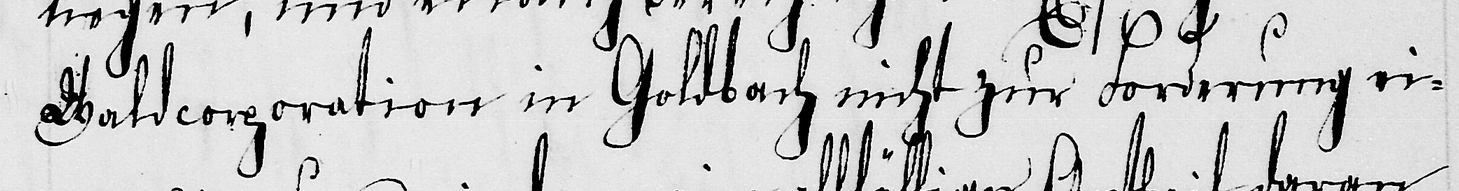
Waldcorporation in Goldbach nicht zur Forderung ei¬
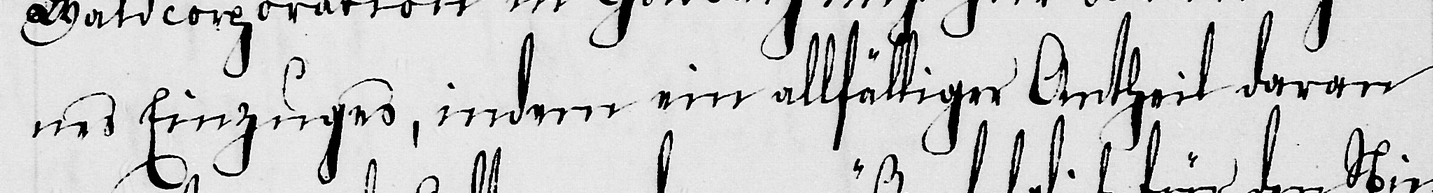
nes Einzuges, indem ein allfälliger Antheil daran
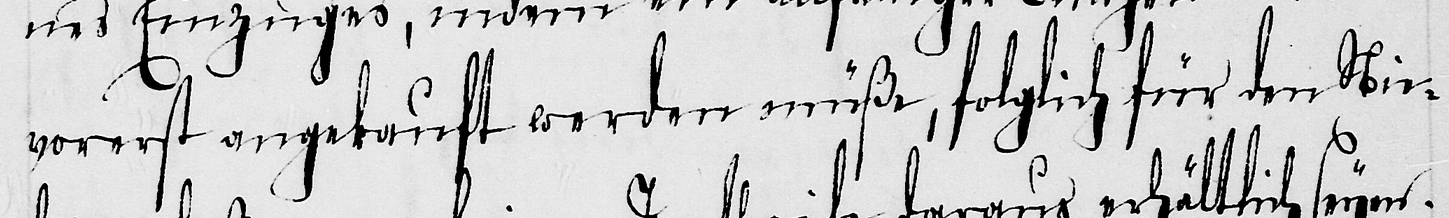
vorerst angekauft werden müße, folglich für den Nie¬
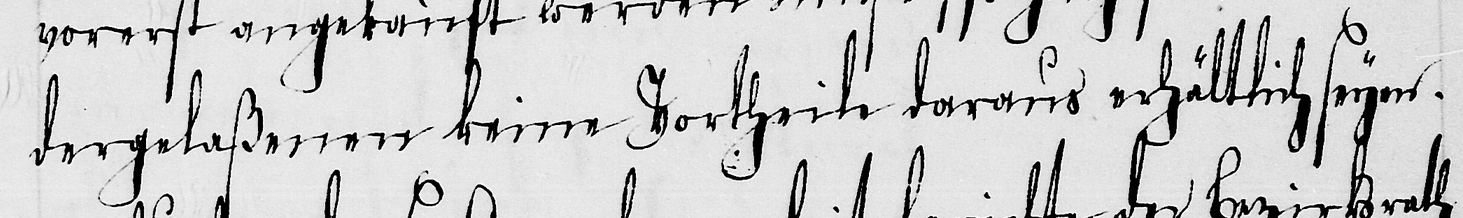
dergelaßenen keine Vortheile daraus erhältlich seye¬
